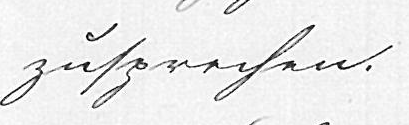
zusprechen.
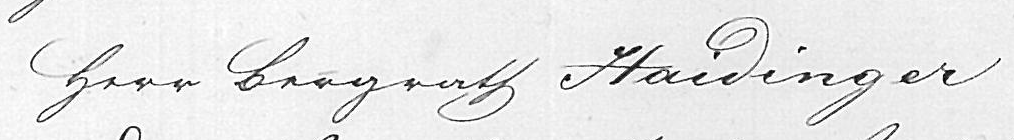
Herr Bergrath Haidinger
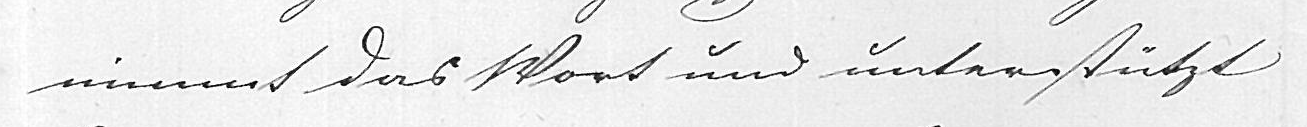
nimmt das Wort und unterstützt
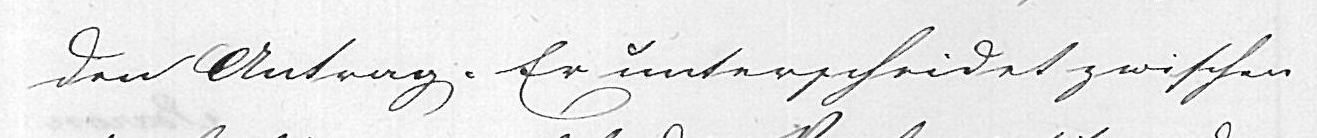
den Antrag. Er unterscheidet zwischen
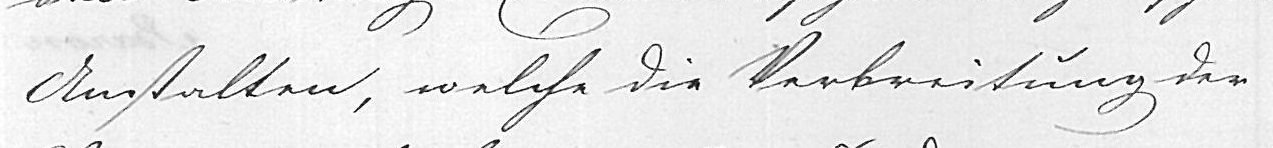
Anstalten, welche die Verbreitung der
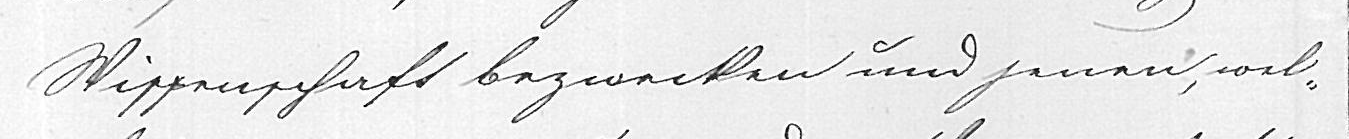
Wissenschaft bezwecken und jenen, wel-
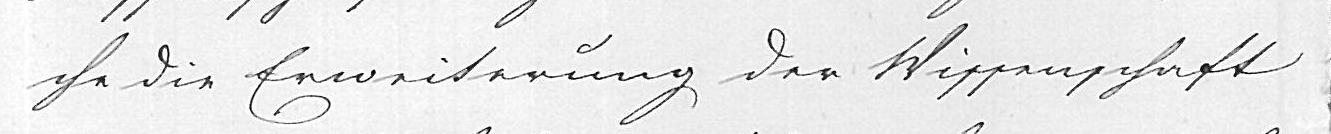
che die Erweiterung der Wissenschaft
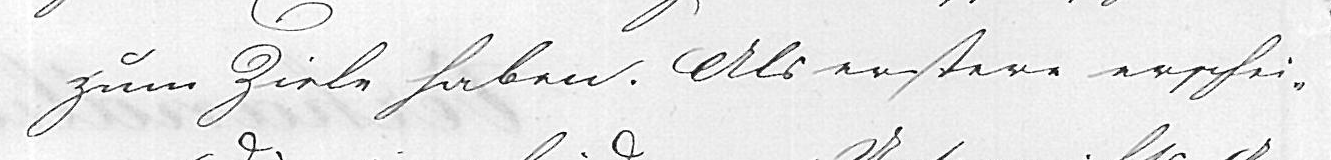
zum Ziele haben. Als erstere erschei-
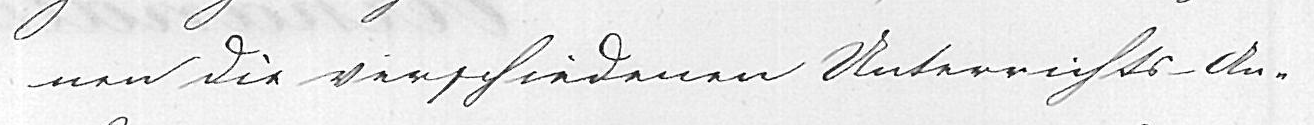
men die verschiedenen Unterrichts-An-
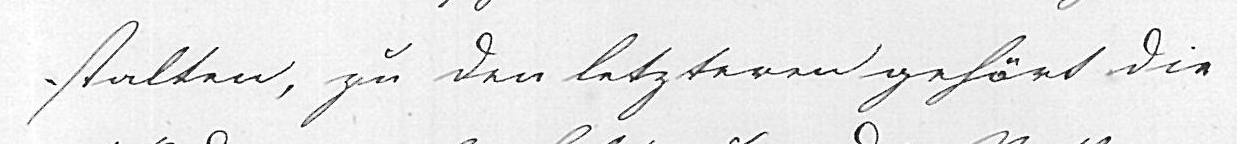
stalten, zu den letzteren gehört die
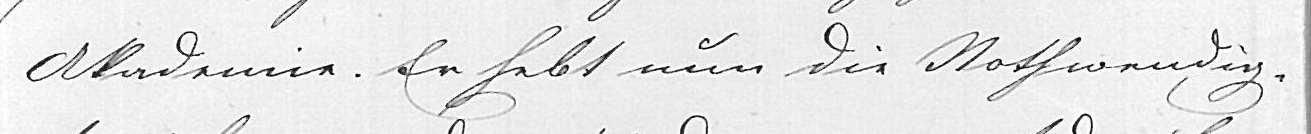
Akademie Er hebt nun die Nothwendig-
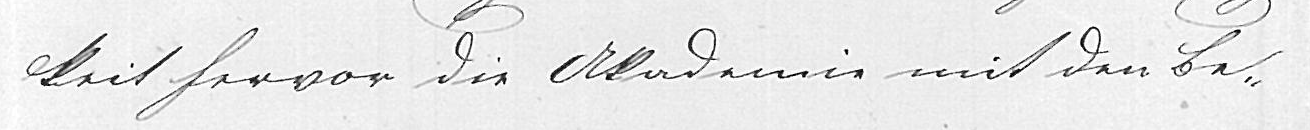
keit hervor die Akademie mit den Be-
